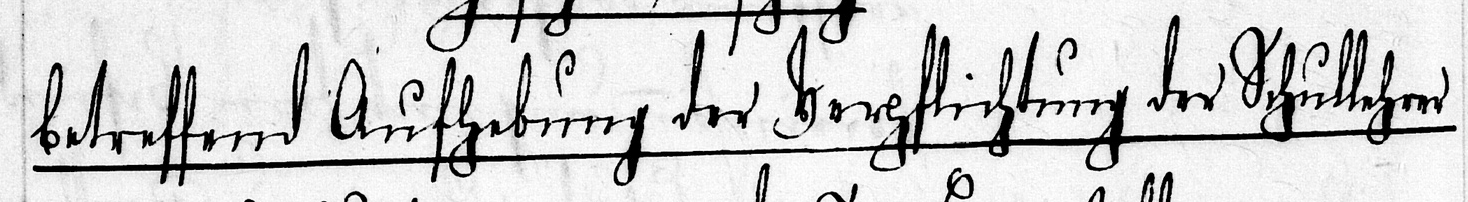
betreffend Aufhebung der Verpflichtung der Schulle¬
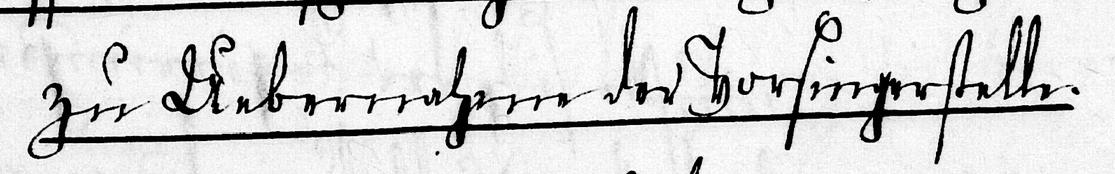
zu Uebernahme der Vorsingerstelle.
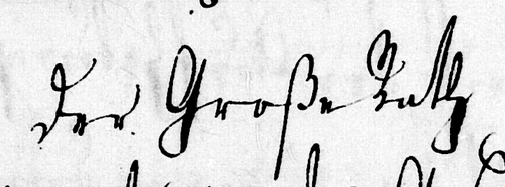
Der Große Rath
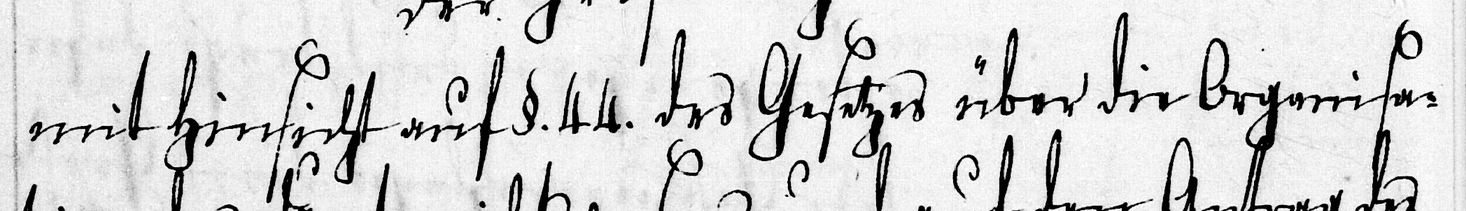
mit Hinsicht auf §. 44. des Gesetzes über die Organisa¬
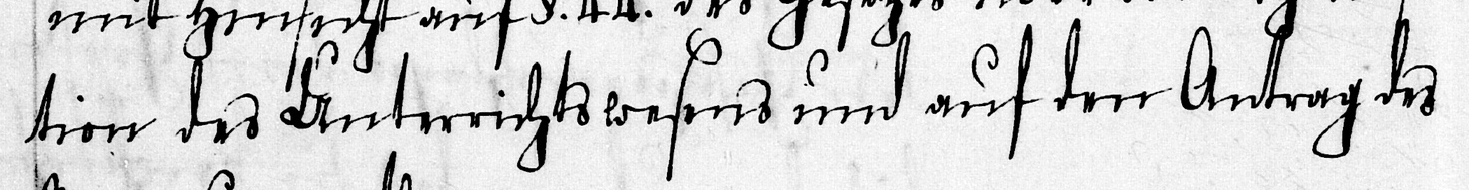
tion des Unterrichtswesens und auf den Antrag des
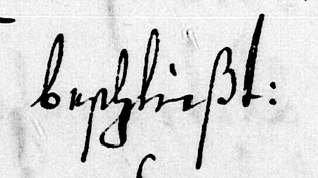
beschließt:
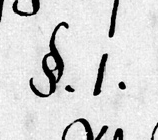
§. 4.
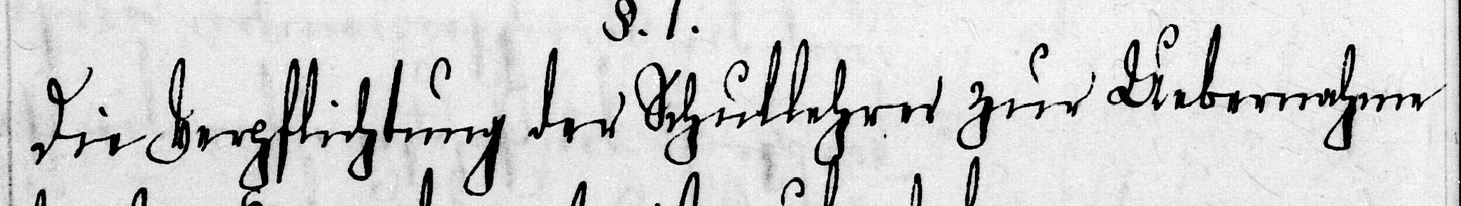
Die Verpflichtung der Schullehrer zur Uebernahme
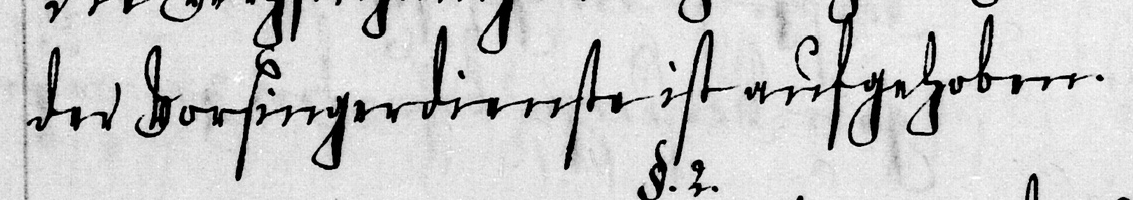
der Vorsingerdienste ist aufgehoben.
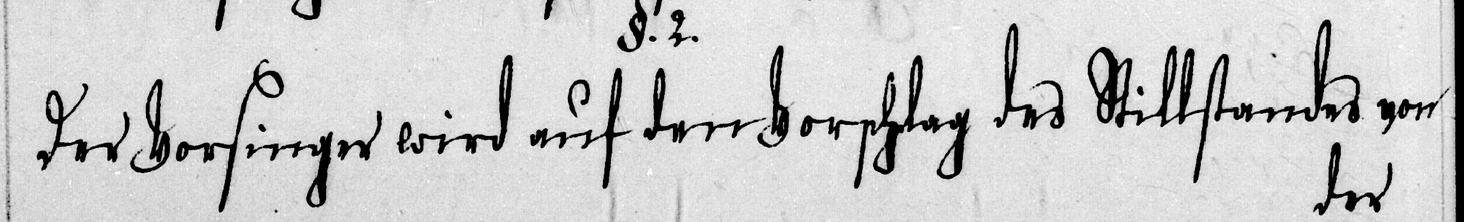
Der Vorsinger wird auf den Vorschlag des Stillstan¬
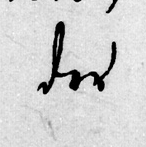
der
